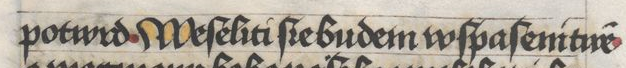potwrd.Weſeliti ſie budem v ſpaſeni twē.
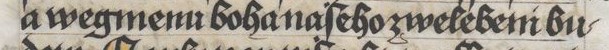a wegmenu boha naẛeho zwelebeni bu¬
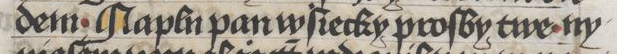dem.Napln pan wẛiecky proſby twe.ny¬
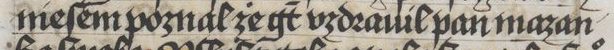nieſem poznal że ḡt uzdravil pan mazan¬
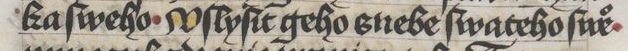ka ſweho.Vſlyẛit geho snebe ſwateho ſweo
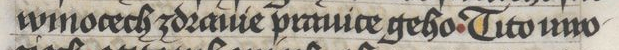v mocech zdravie pravice geho.Tuto uwo¬
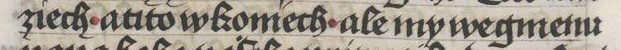ziech.a tito w koníech.ale my wegmenu
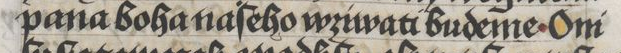pana boha naẛeho wzíwati budeme.Oni
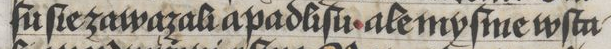ſu ſie zawazali a padliſu.ale myſme wſta¬
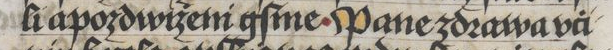li a pozdwiżeni gſme.Pane zdrawa vċi¬
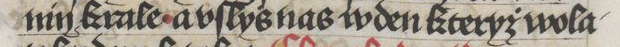nin krale.a uſlyṡ nas w den kteryż wola¬
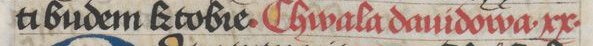ti budem k tobie.Chwala davidowa.xx.
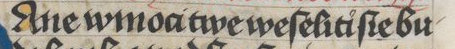Ane wmoci twe weſeliti ſie bu¬
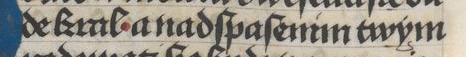de kral.a nadſpaſením twým
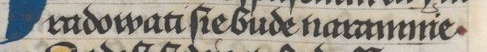radowati ſie bude naramnie.
